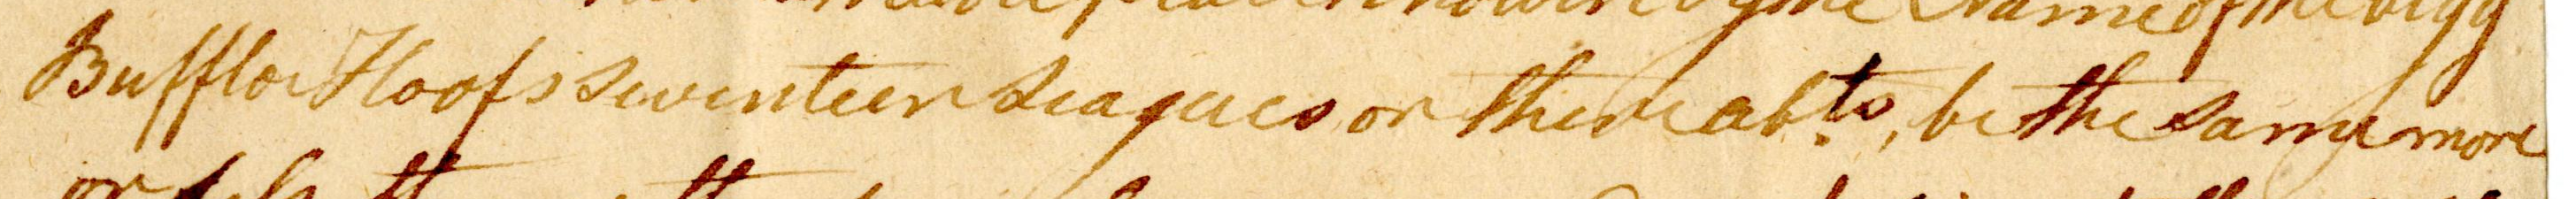Buffalo Hoofs seventeen Leagues or thereab^ts., be the same more
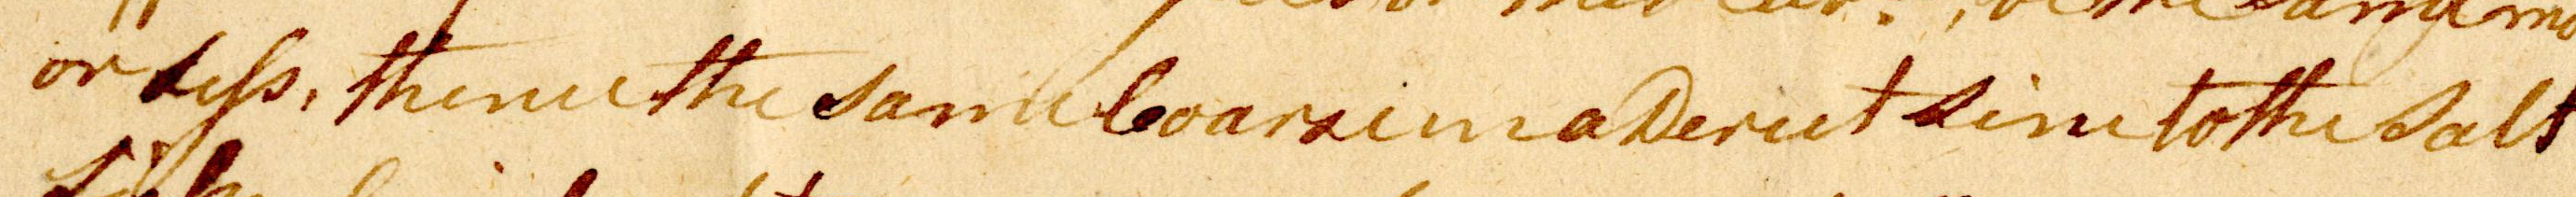or less, thence the same Coars in a derect Line to the Salt
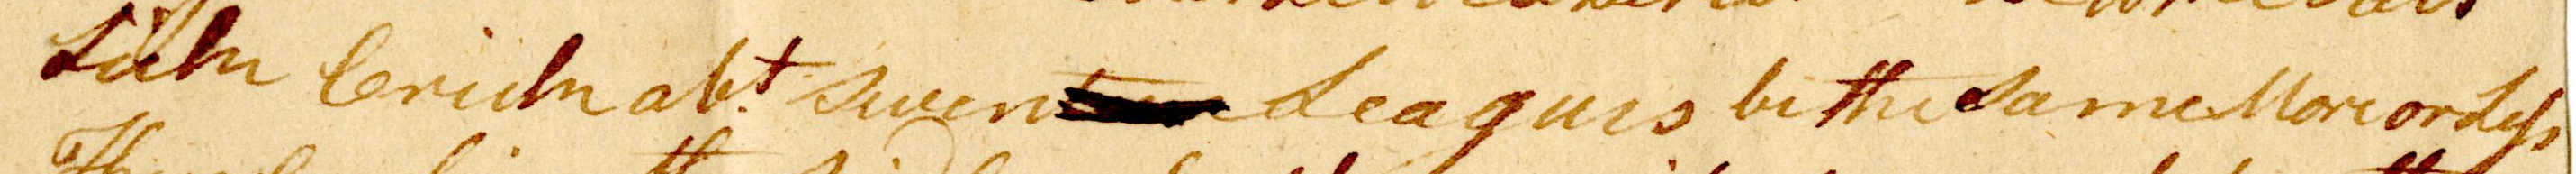Lick Crick ab^t. seven[teen] Leagues be the Same more or less
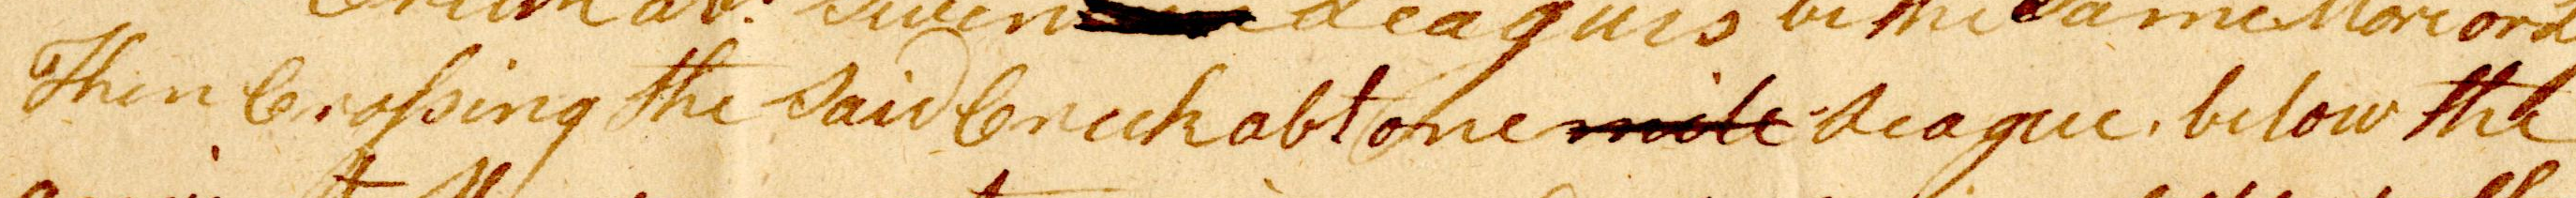Then Crossing the said Creek about one [mile] League, below the
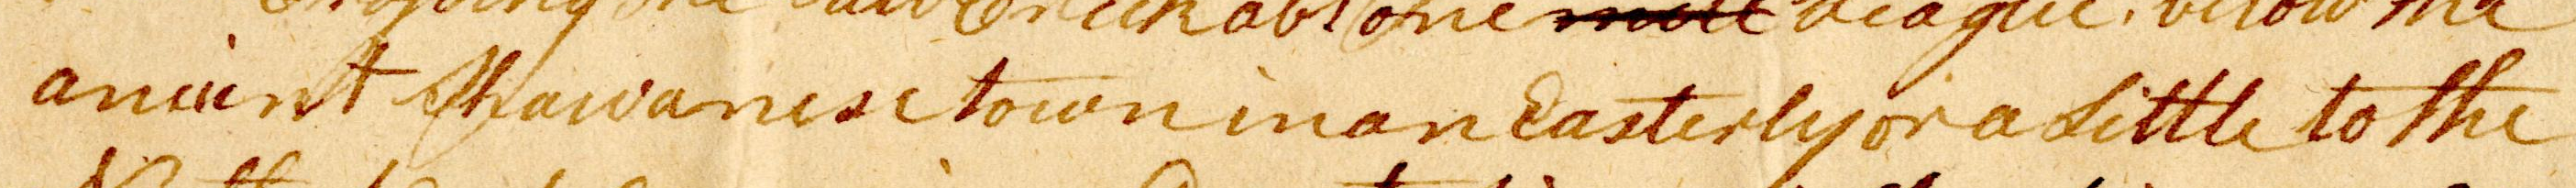ancient Shawanese Town in an Easterly or a Little to the
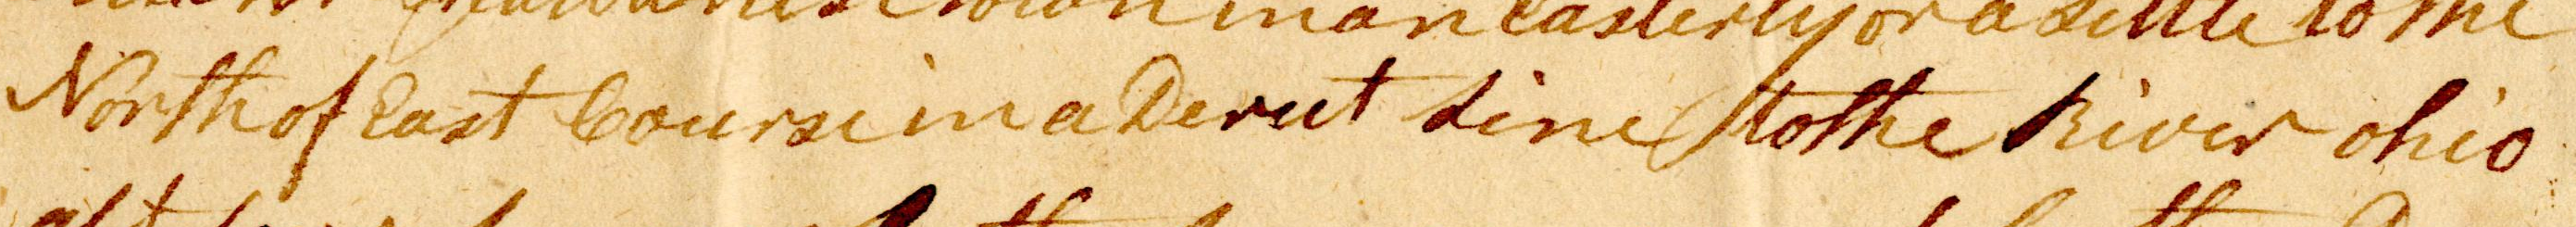North of East Course in a Derect Line to the River Ohio
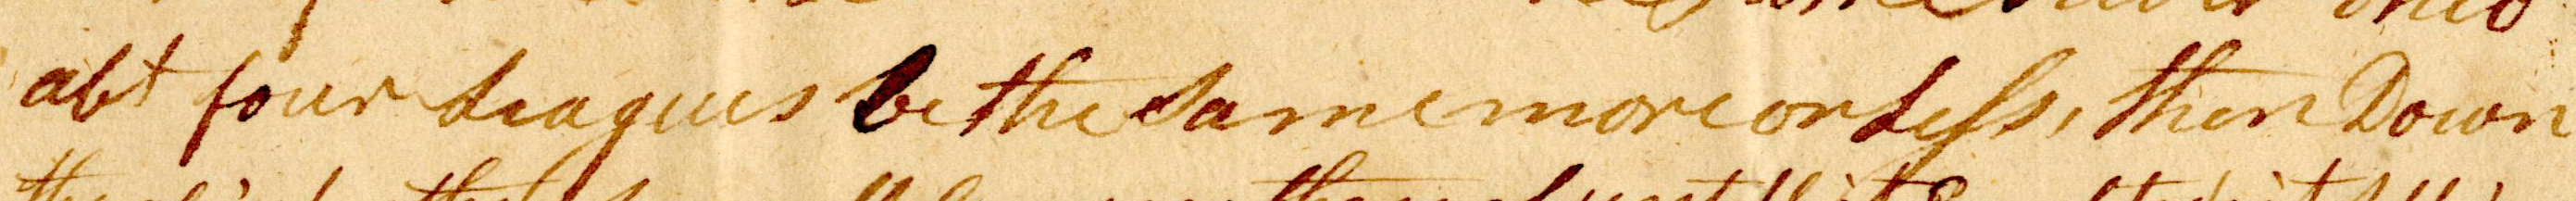ab^t four Leagues be the same more or less, then Down
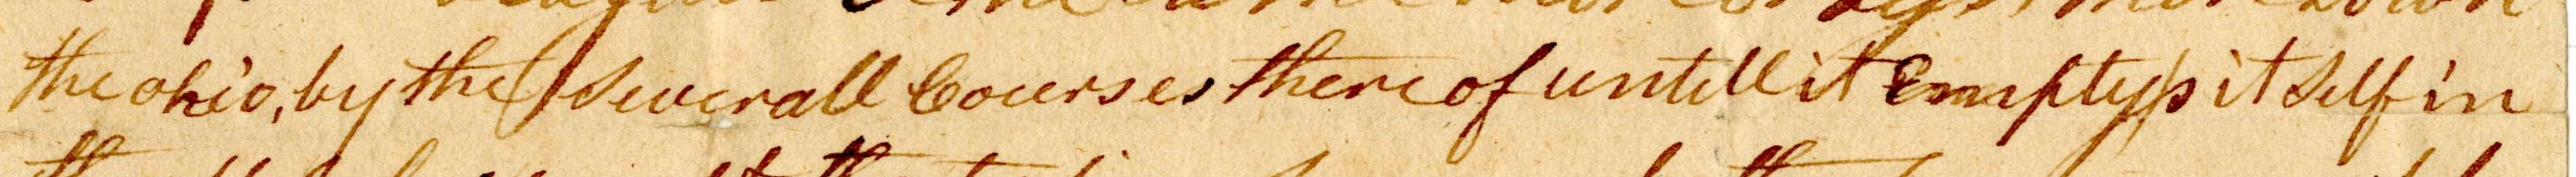the Ohio, by the severall Courses is there of untill it Empty's itself in
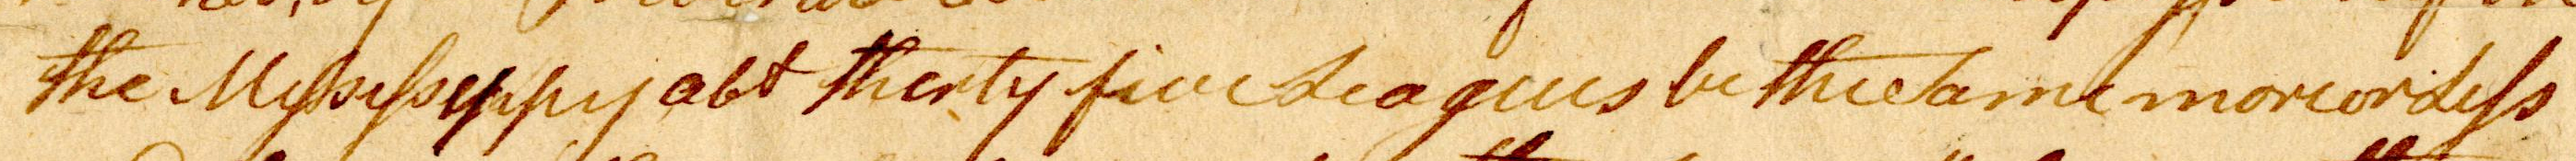The Mississippi ab^t thirty five leagues be the same more or less
